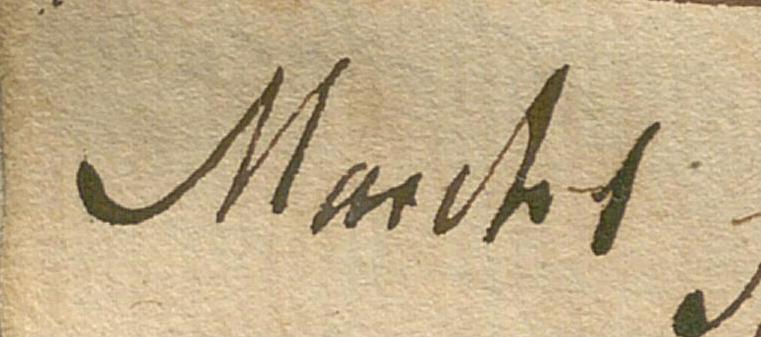March 1
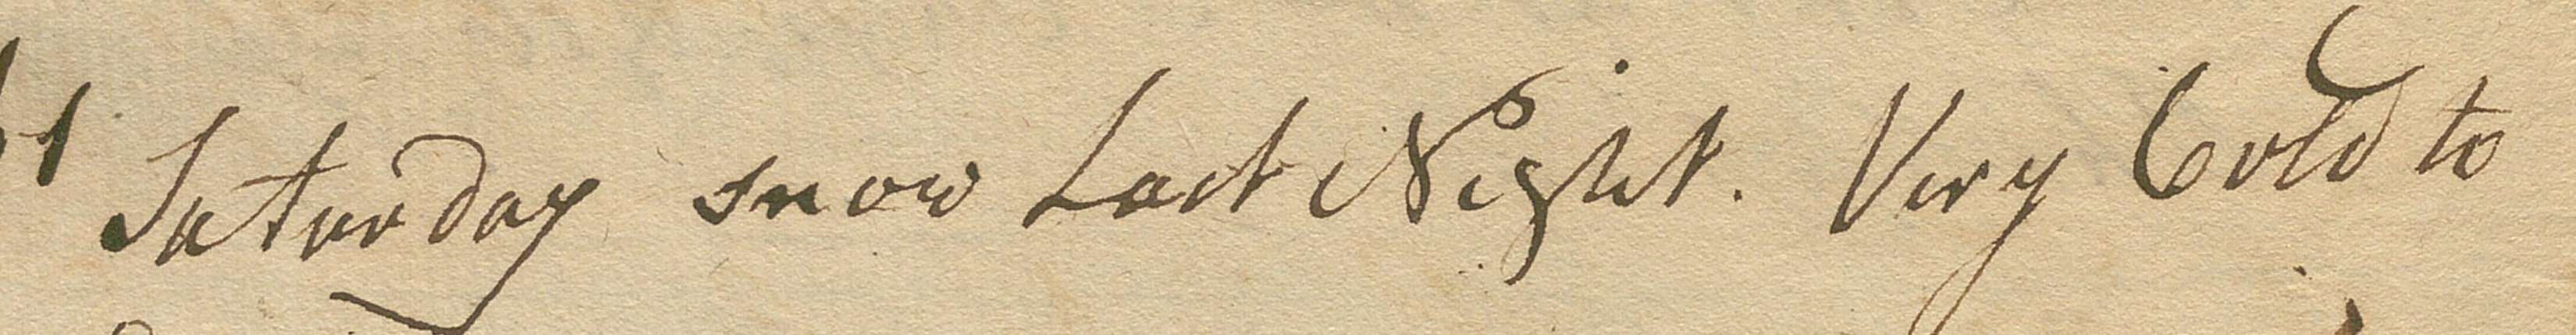Saturday snow Last Night. Very Cold to
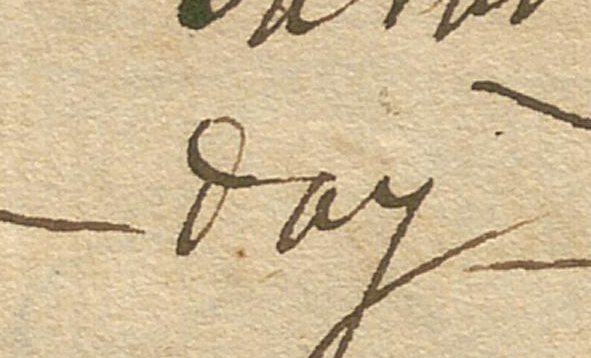day
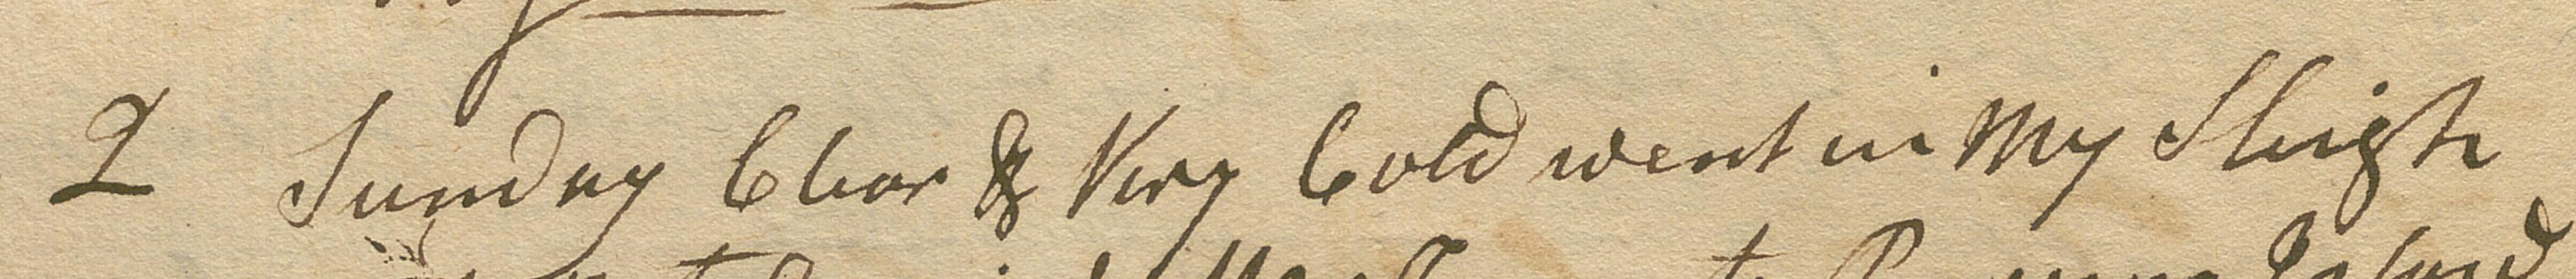2 Sunday Clear & Very Cold went in My Sleigh
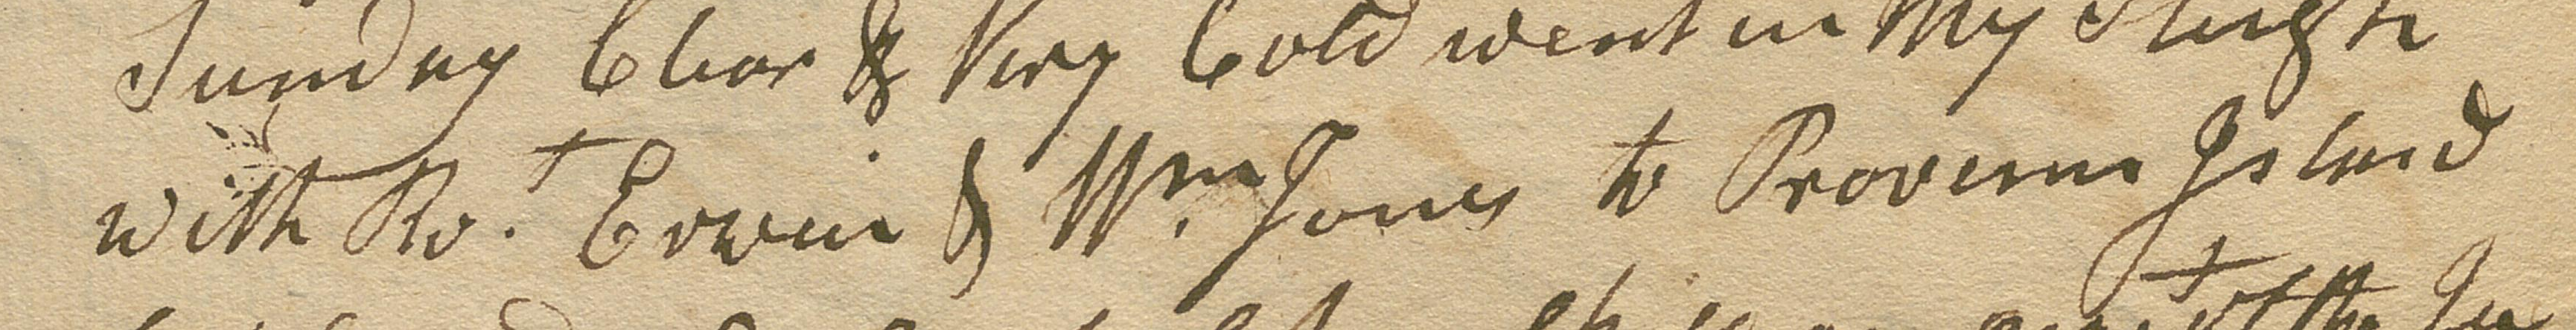with Ro^t. Erwin & W^m. Jones to Provence Island
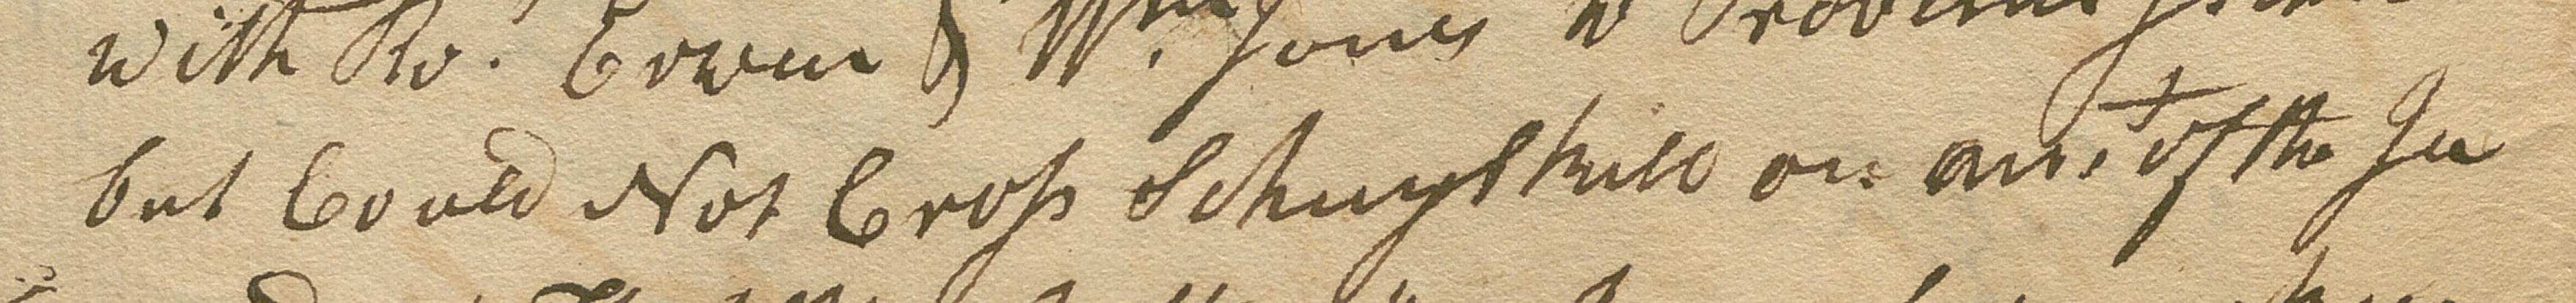but Could Not Cross Schuylkill on acc^t of the Ice
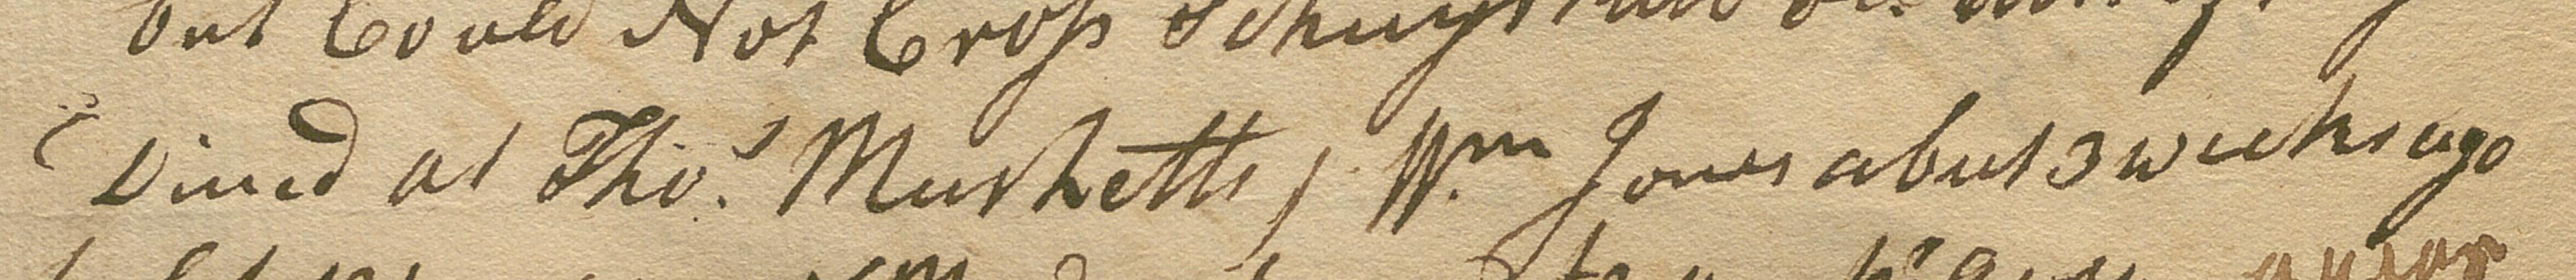Dined at Tho^s. Mushetts, W^m. Jones abut 3 weeks ago
